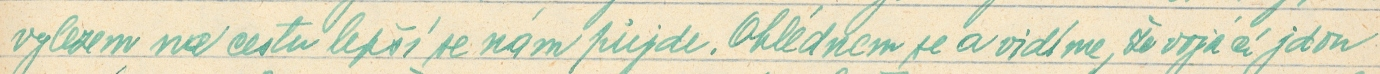vylezem na cestu lepší se nám půjde. Ohlédnem se a vidíme, že vojácí jdou
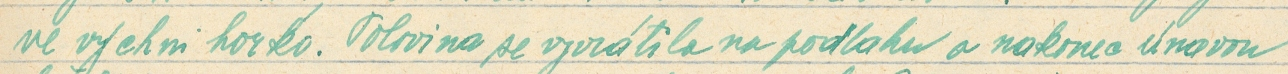ve výchni horko. Polovina se vyvrátila na podlahu a nakonec únavou
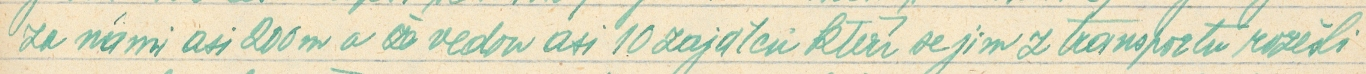za námi asi 200 m a že vedou asi 10 zajatců kteří se jim z transportu rozešli
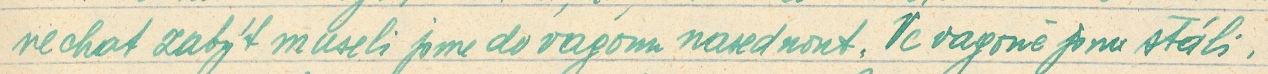nechat zabýt museli jsme do vagonu nasednout. Ve vagoně jsme stáli,
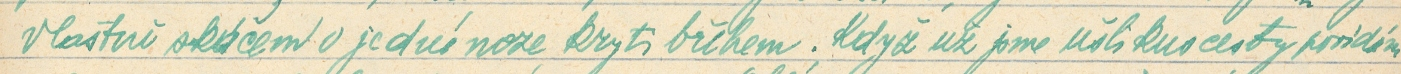vlastně skáčem o jedné noze kryti břehem. Když už jsme ušli kus cesty povídám
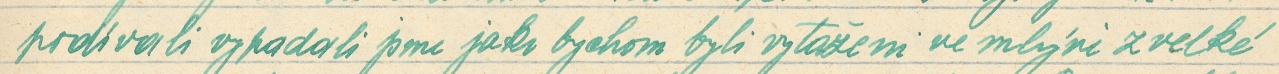podívali vypadali jsme jako bychom byli vytaženi ve mlýně z velké
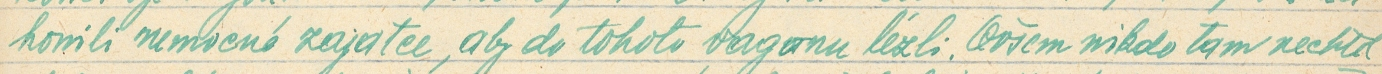honili nemocné zajatce, aby do tohoto vagonu lézli. Ovšem nikdo tam nechtěl
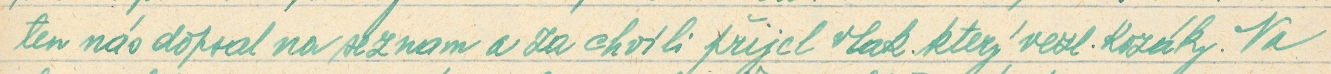ten nás dopsal na seznam a za chvíli přijel vlak který vezl. Kozáky. Na
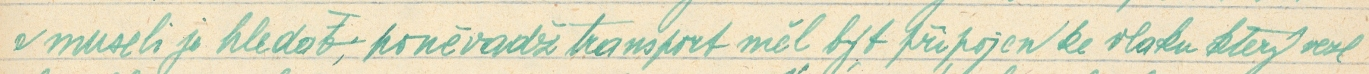a museli je hledat, poněvadž transport měl být připojen ke vlaku který vezl
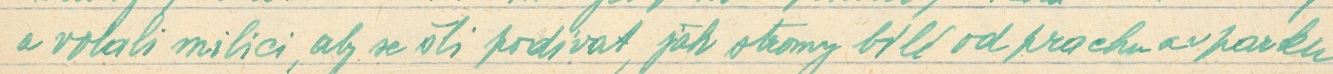a volali milici, aby se šli podívat, jak stromy bílé od prachu a v parku
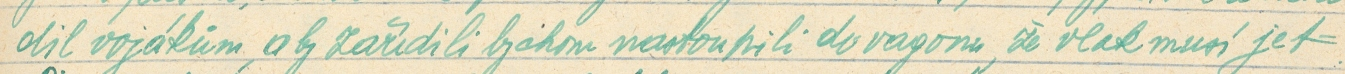dil vojákům, aby zařídili bychom nastoupili do vagonu, že vlak musí jet.
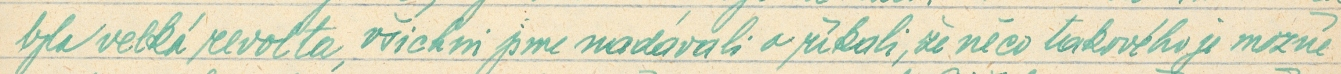byla velká revolta, všichni jsme nadávali a říkali, že něco takového je možné
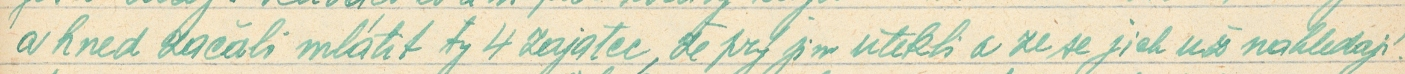a hned začali mlátit ty 4 zajatce, že prý jim utekli a ze se jich už nahledají.
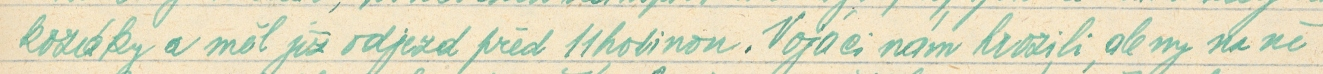kozáky a měl již odjezd před 11 hodinou. Vojáci nám hrozili, ale my na ně
